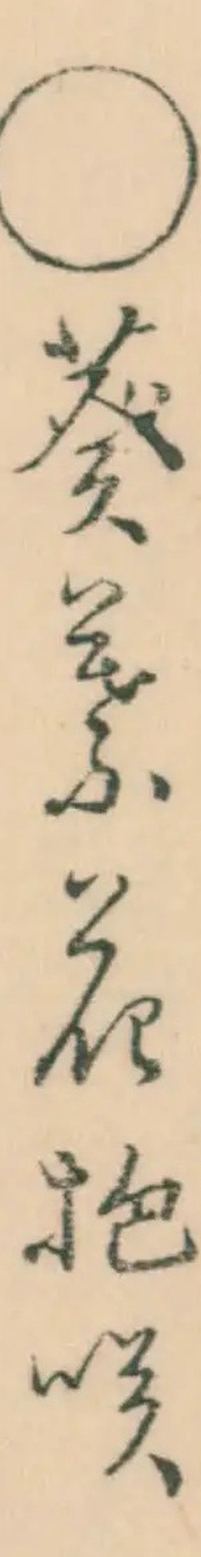○葵葉花抱咲
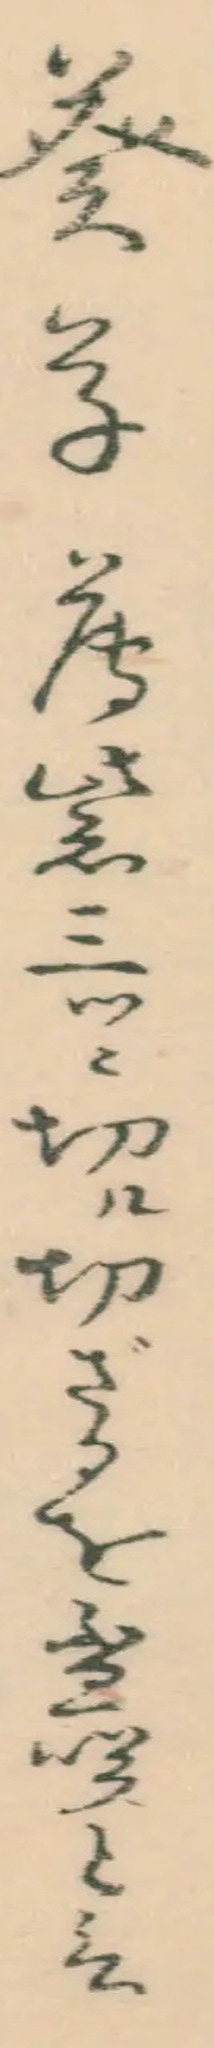葵草薄紫三つに切る切ざるを咲と言
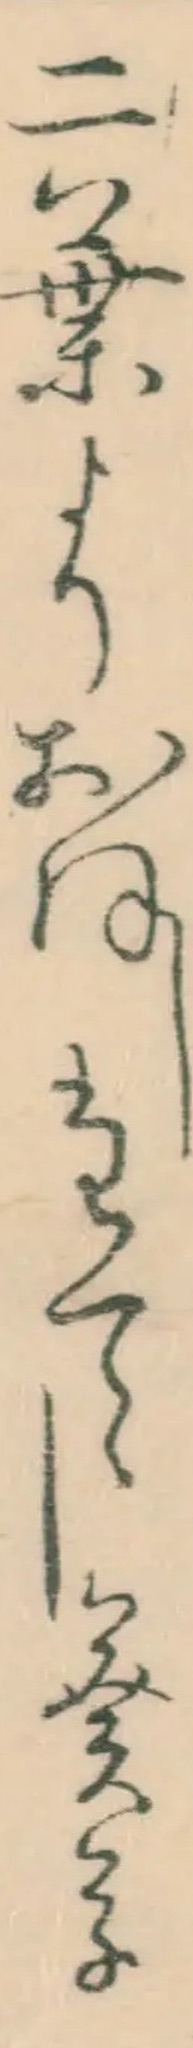二葉よりおほしてゝし葵草
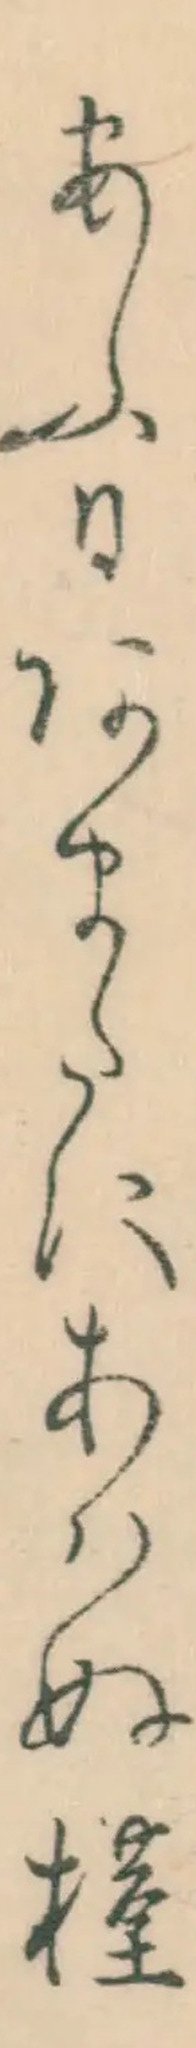あふあまたにあはぬ槿鷹
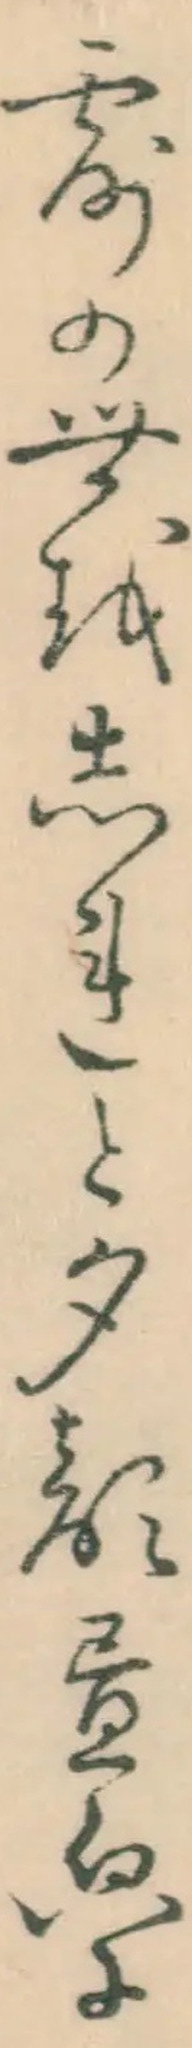露の世をしれと夕顔昼皃に
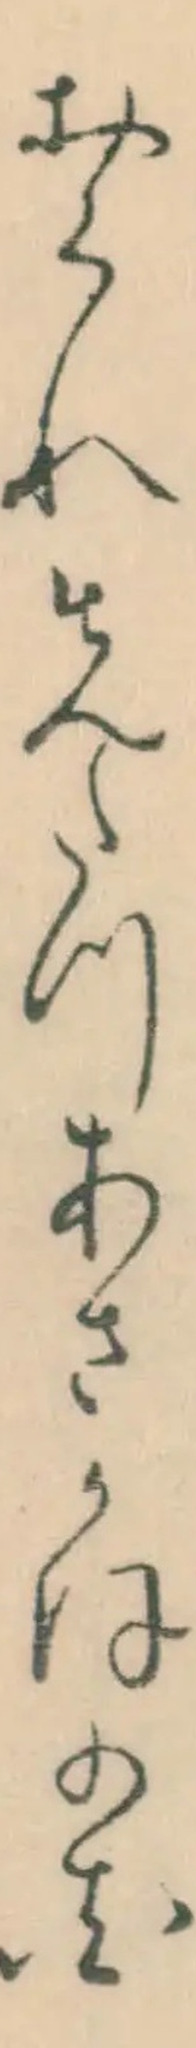おくれ先たつあさかほの花丸

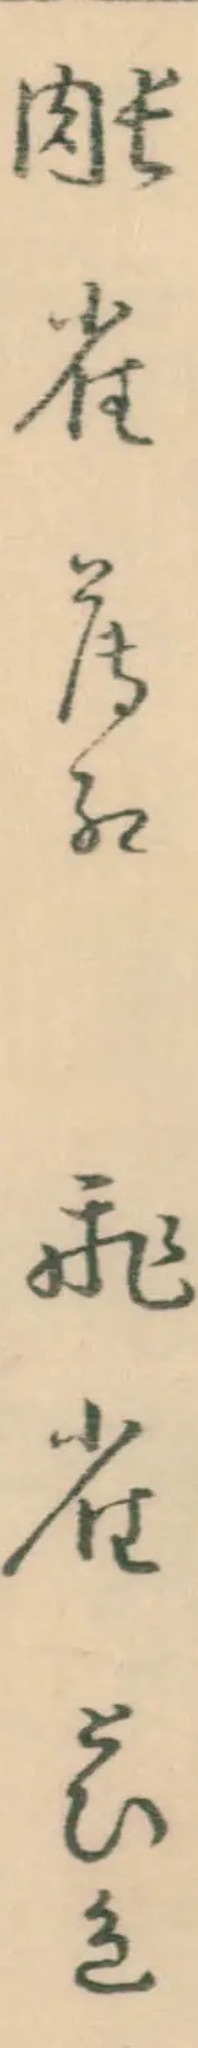脹雀薄紅飛雀とひ色
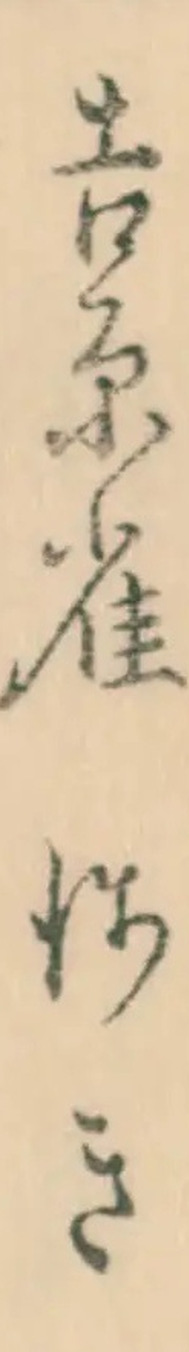吉原雀浅き
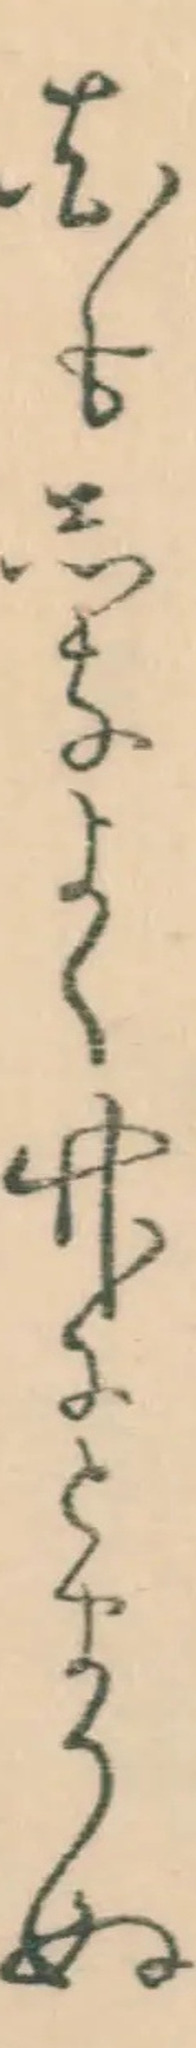花もしなよく竹にとまりぬ桃丸
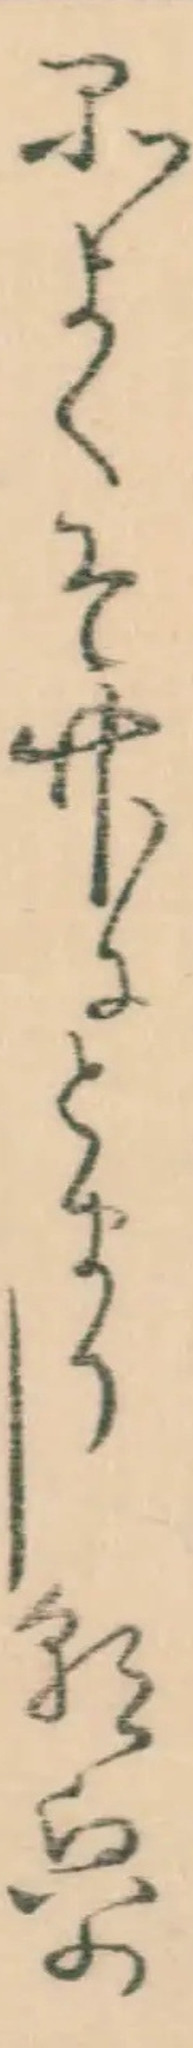品よくそ竹にとまりし朝皃の
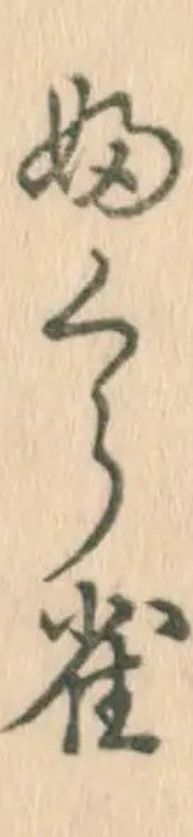ふくら雀

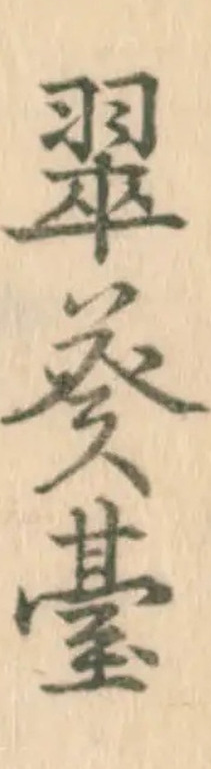翠葵台
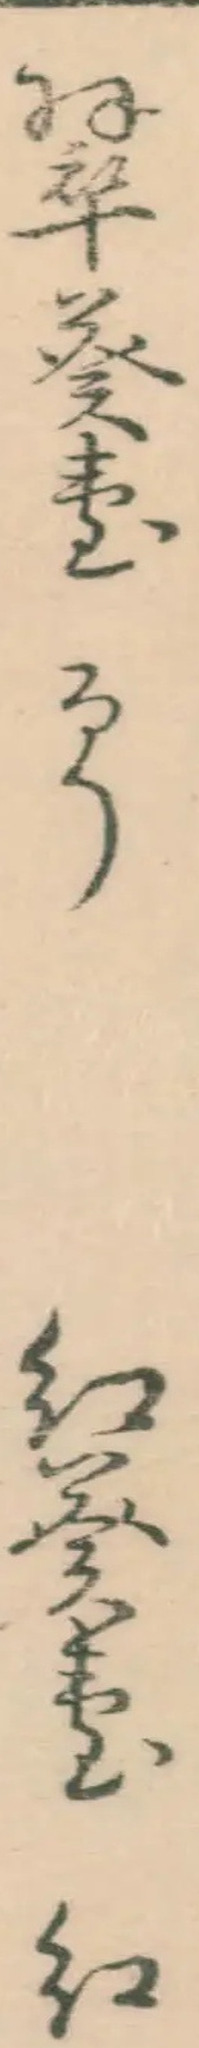翠葵台るり紅葵台紅
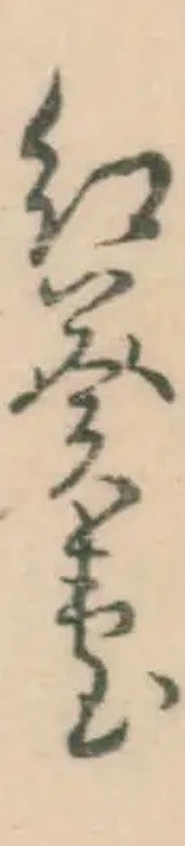翠葵台
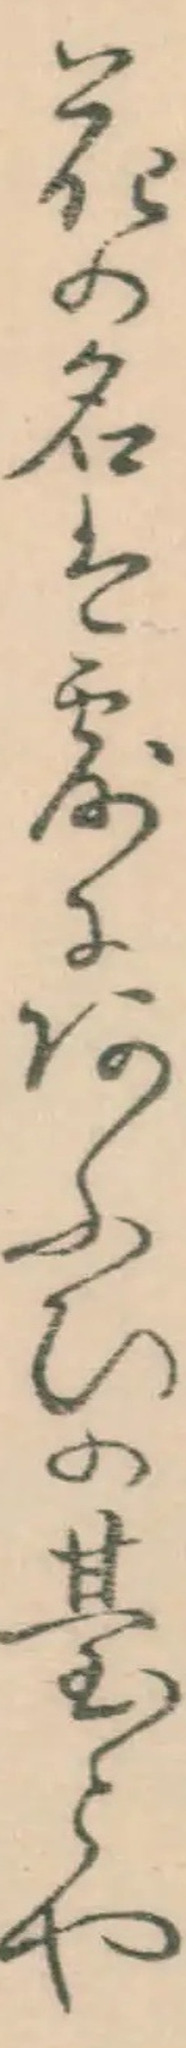花の名は露にあふひの台とや
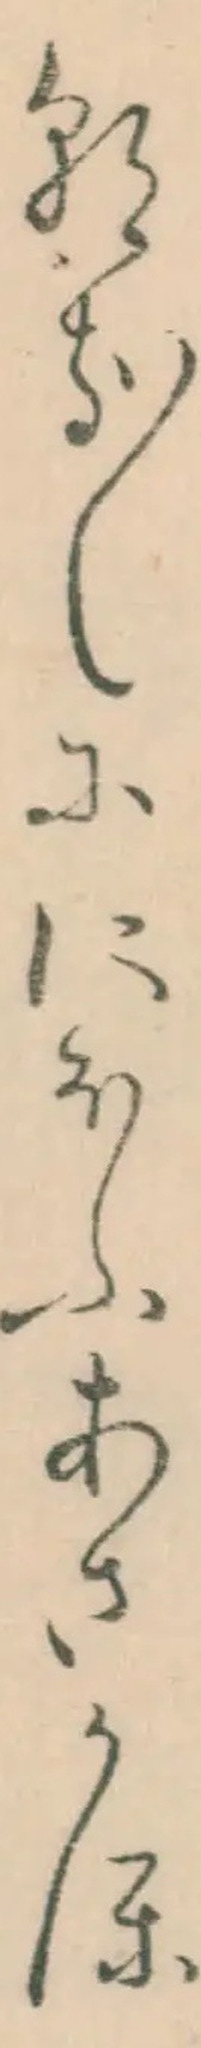朝な〳〵ににほふあさかほ燕賢
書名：花壇朝顔通 2巻. [1]
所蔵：国立国会図書館 National Diet Library, JAPAN
